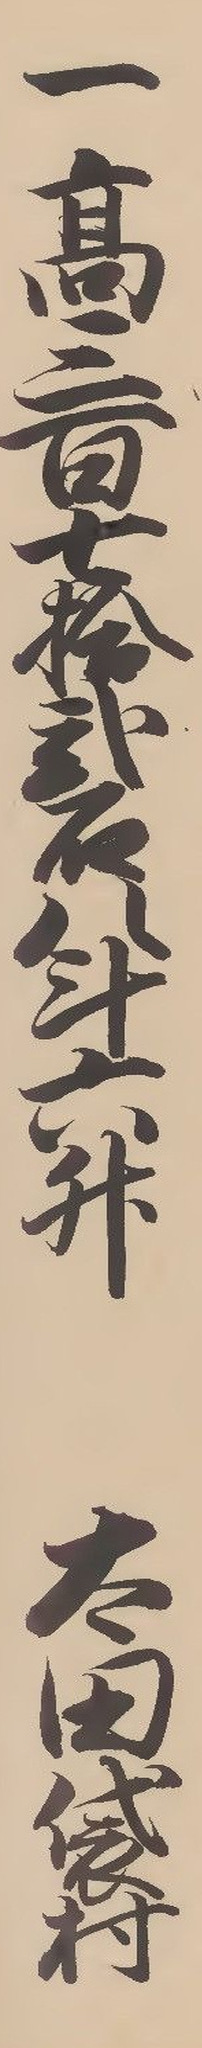一高三百七拾弐石八斗六升太田袋村
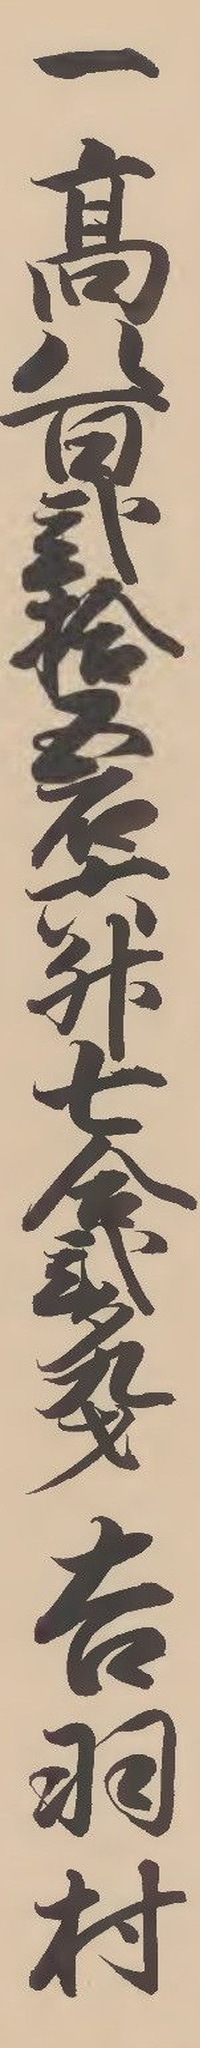一高八百弐拾五石六升七合弐勺九才吉羽村
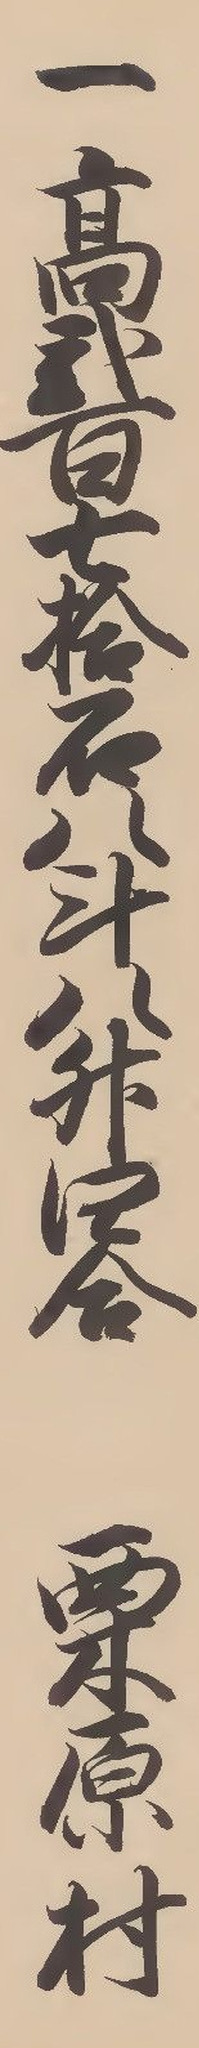一高弐百七拾石八斗八升四合栗原村
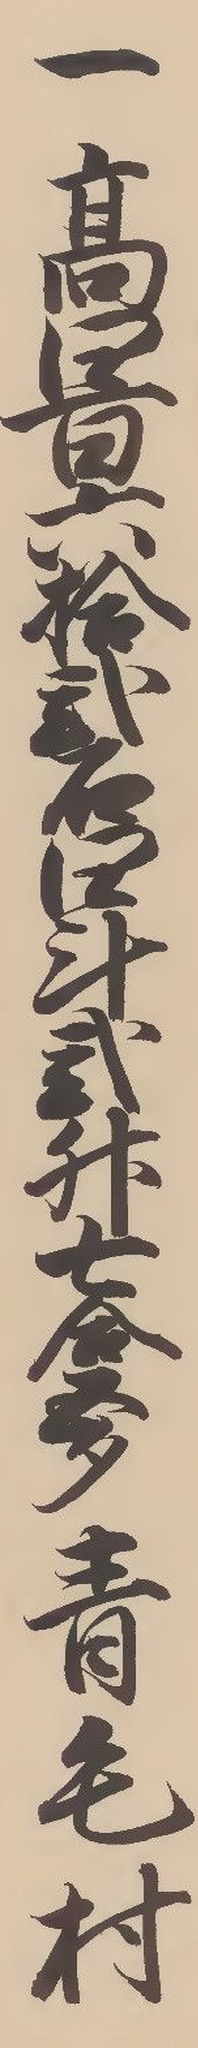一高四百六拾弐石四斗弐升七合五勺青毛村

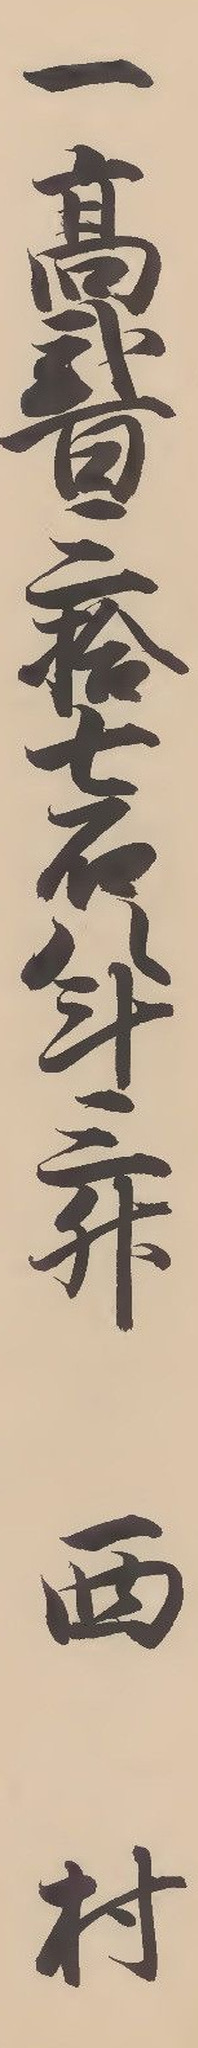一高弐百三拾七石八斗三升西村
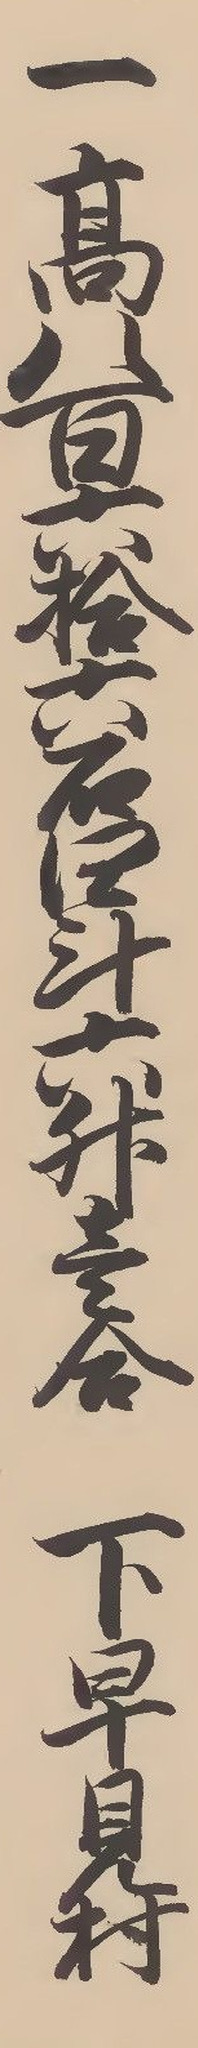一高八百六拾六石四斗六升壱合下早見村
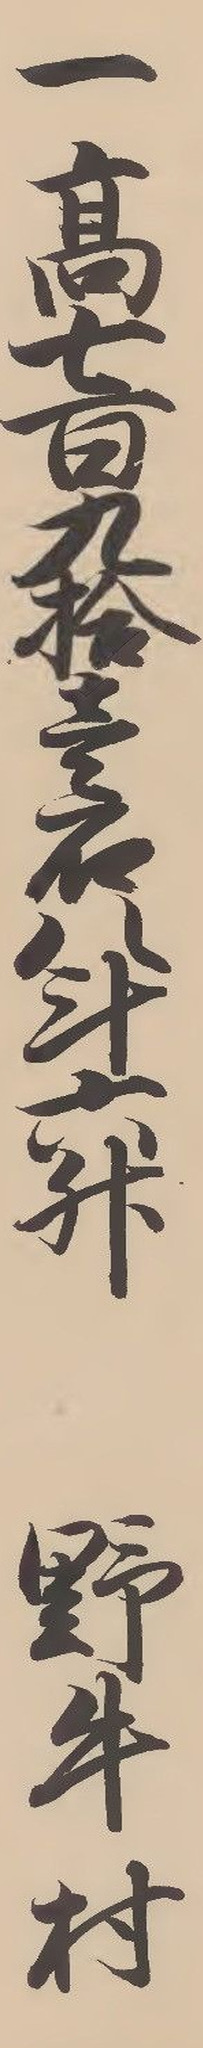一高七百九拾壱石八斗六升野牛村
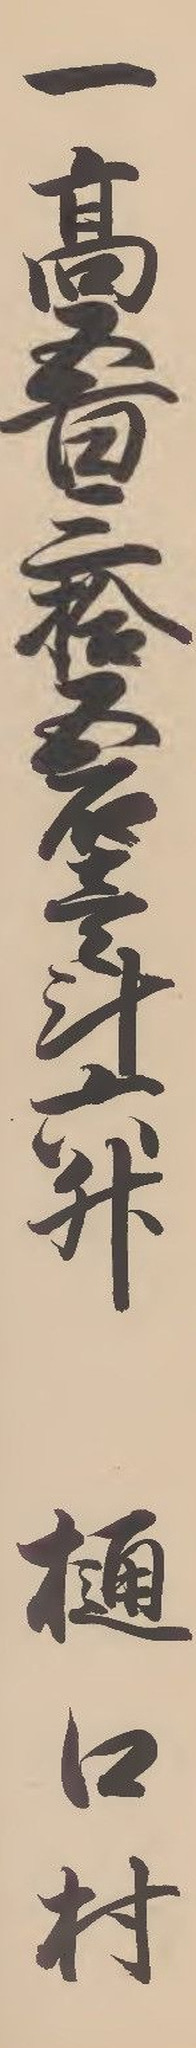一高五百三拾五石壱斗六升樋口村
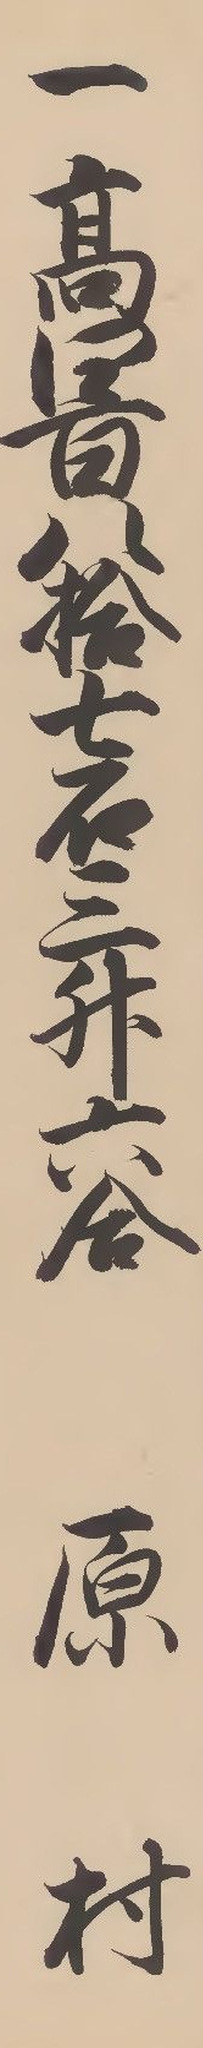一高四百八拾七石三升六合原村
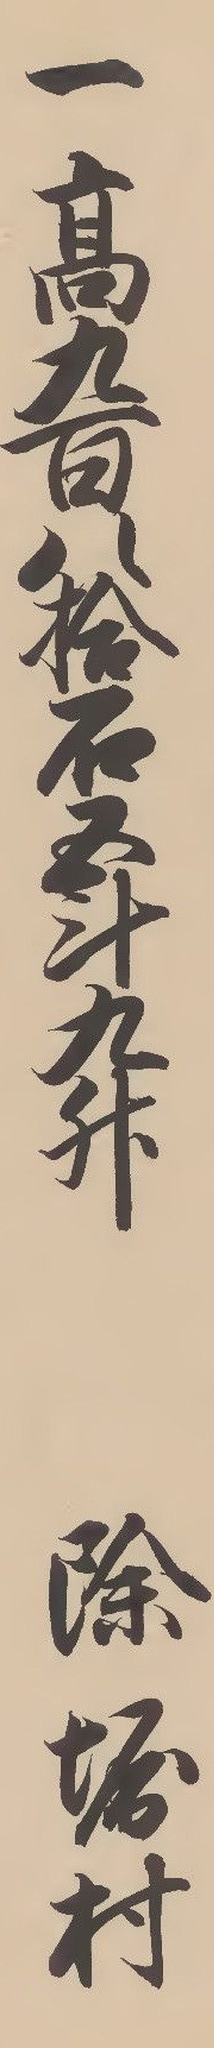一高九百八拾石五斗九升除堀村
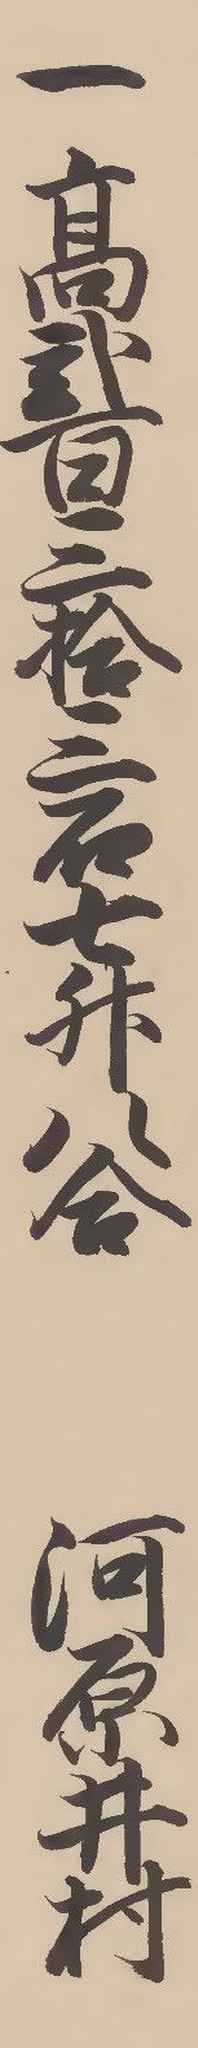一高弐百三拾三石七升八合河原井村
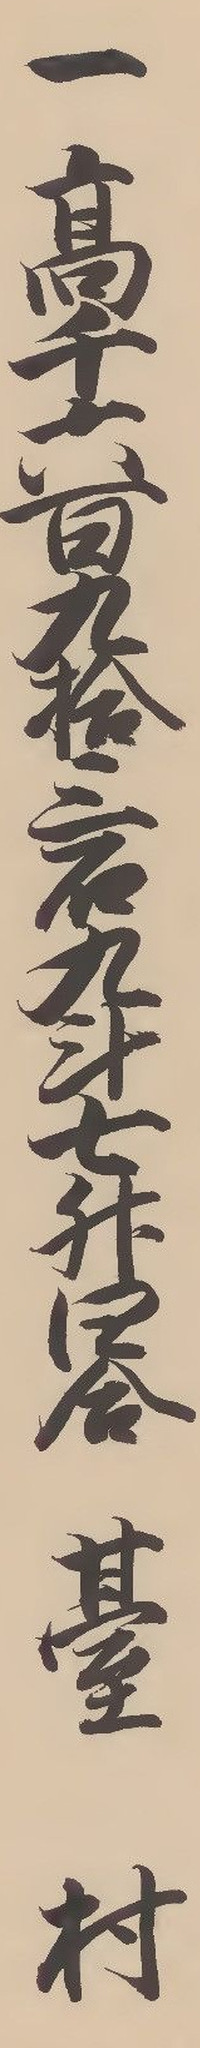一高千六百九拾三石九斗七升四合台村

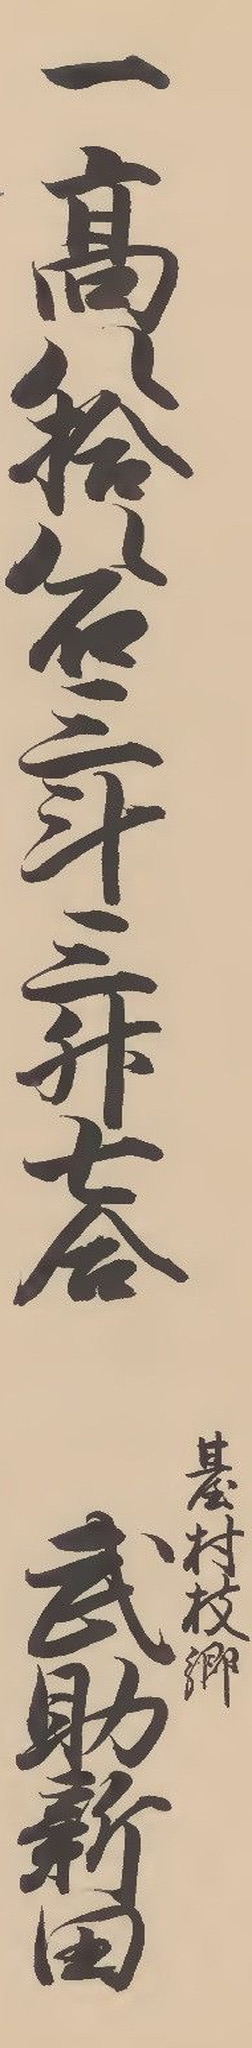一高八拾八石三斗三升七合武助新田
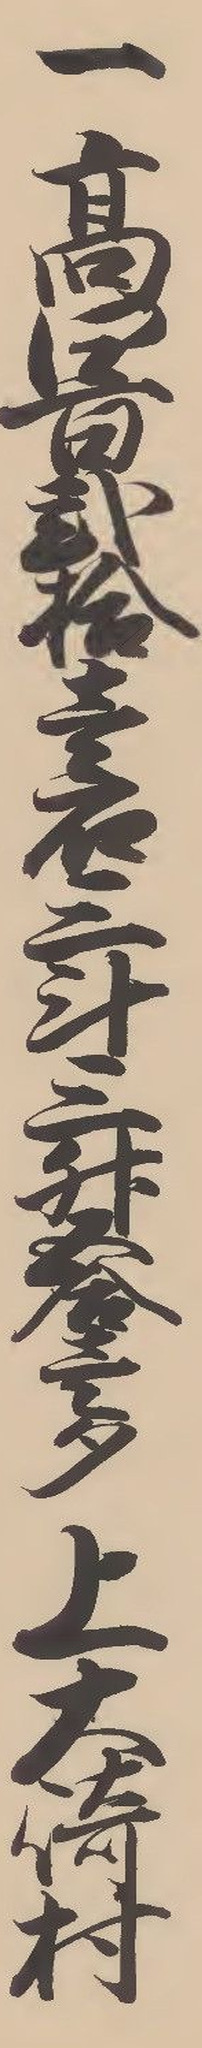一高四百弐拾壱石三斗三升五合七勺上大崎村
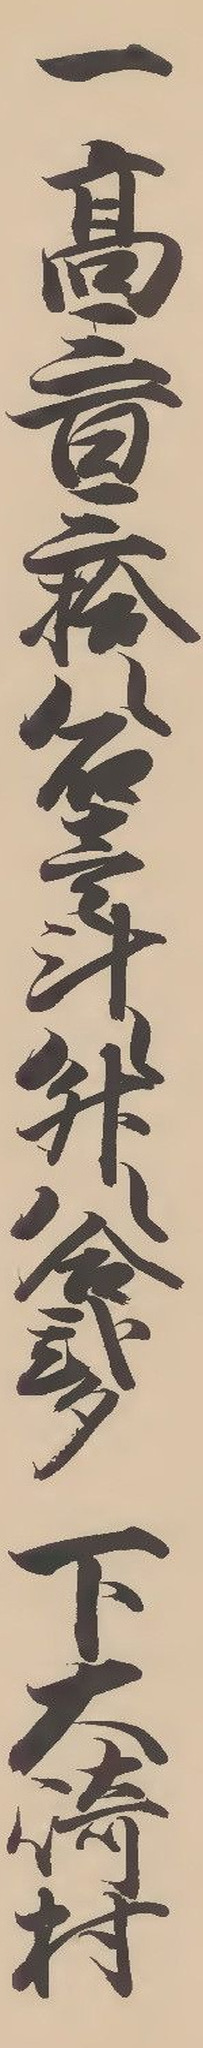一高三百三拾八石壱斗八升八合弐勺下大崎村
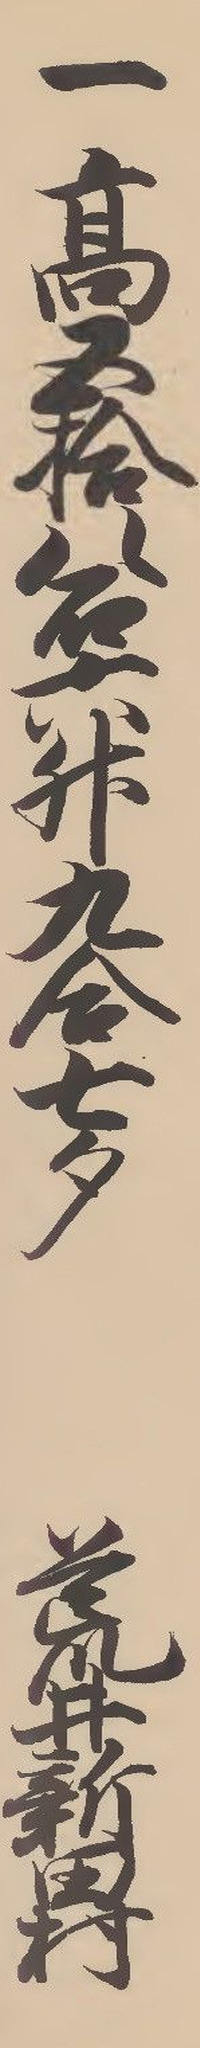一高五拾八石六升九合七勺荒井新田村
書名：武蔵国郷帳　下
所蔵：国立公文書館 National Archives of Japan
